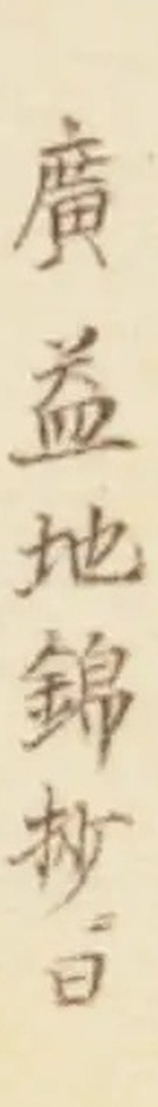廣益地錦抄に曰

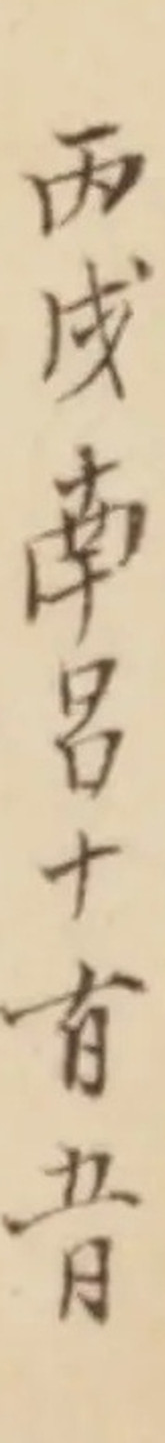丙戌南呂十有五日
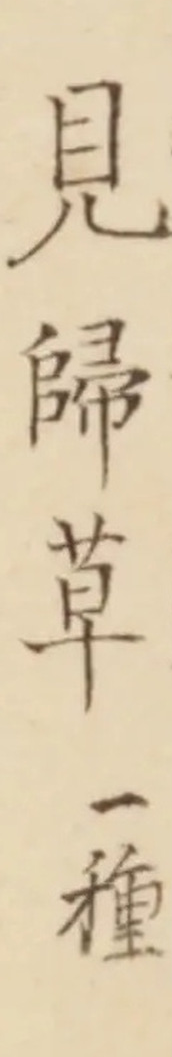見歸草一種
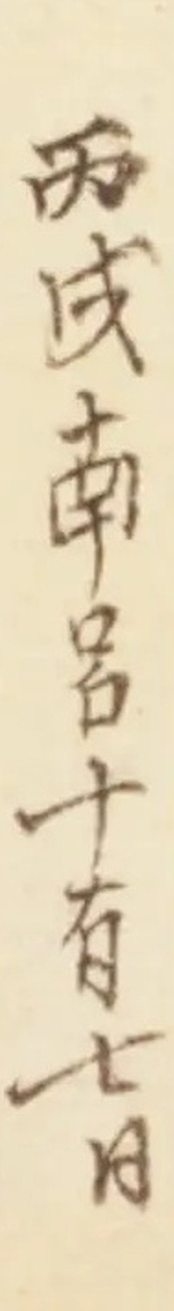丙戌南呂十有七日
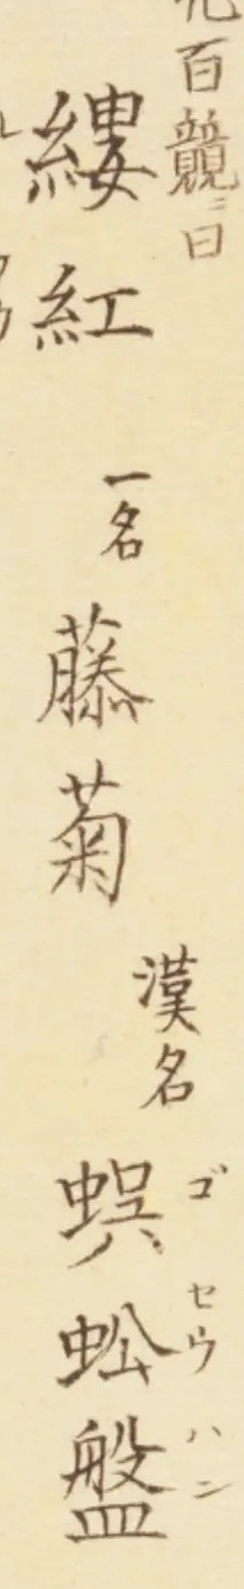縷紅一名藤菊漢名蜈蚣盤
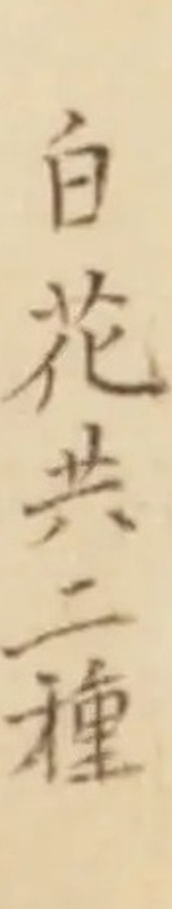白花共二種

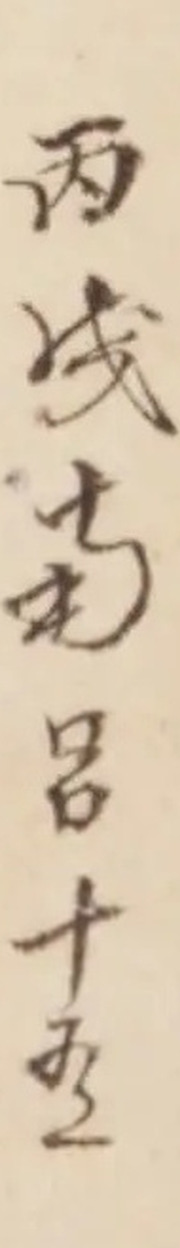丙戌南呂十有
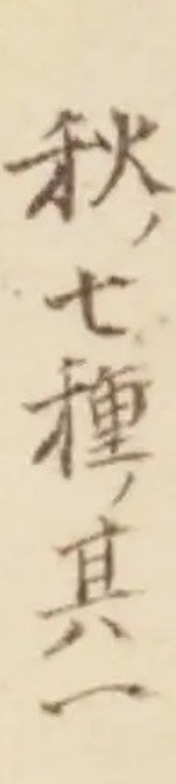秋の七種の其一
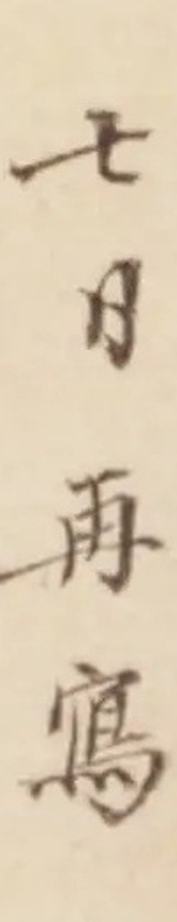七日再寫
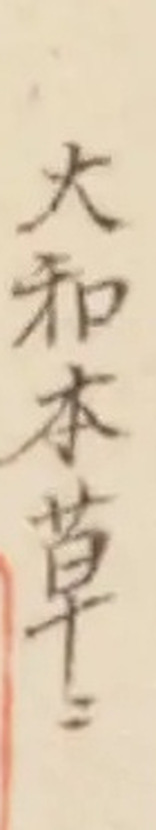大和本草に
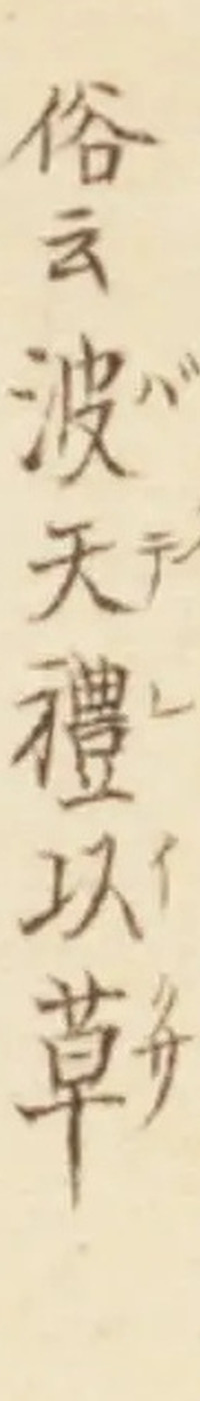俗云波天禮以草
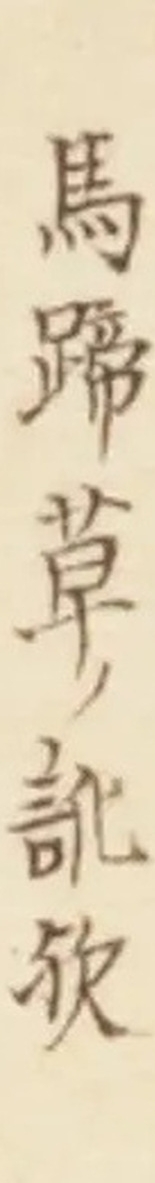馬蹄草の訛欤
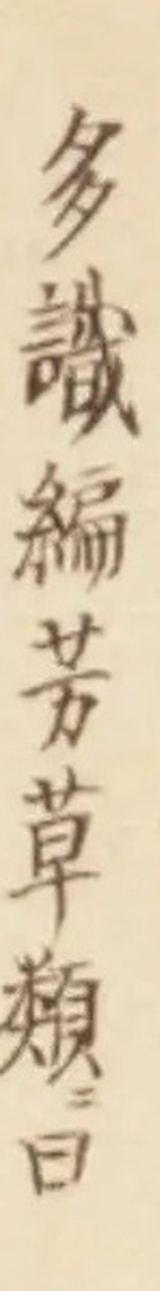多識編芳香草類に曰
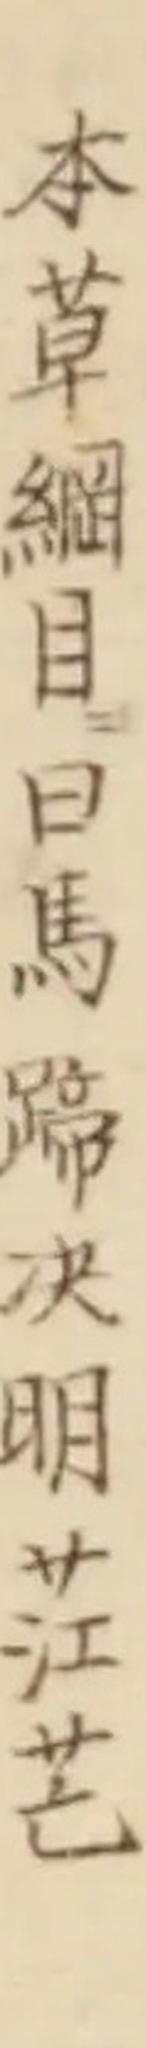本草綱目に曰馬蹄决明子茳芒

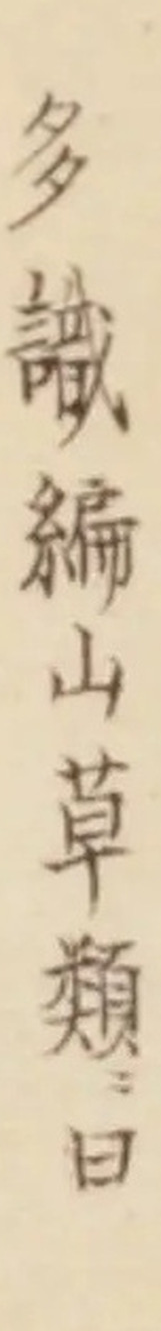多識編山草類に曰
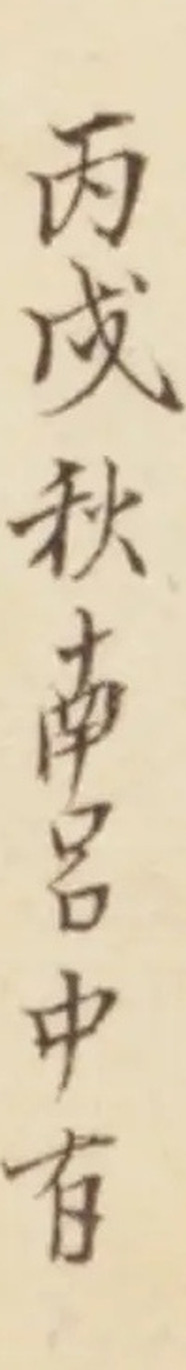丙戌秋南呂中有
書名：梅園草木花譜秋之部. 3
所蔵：国立国会図書館 National Diet Library, JAPAN
